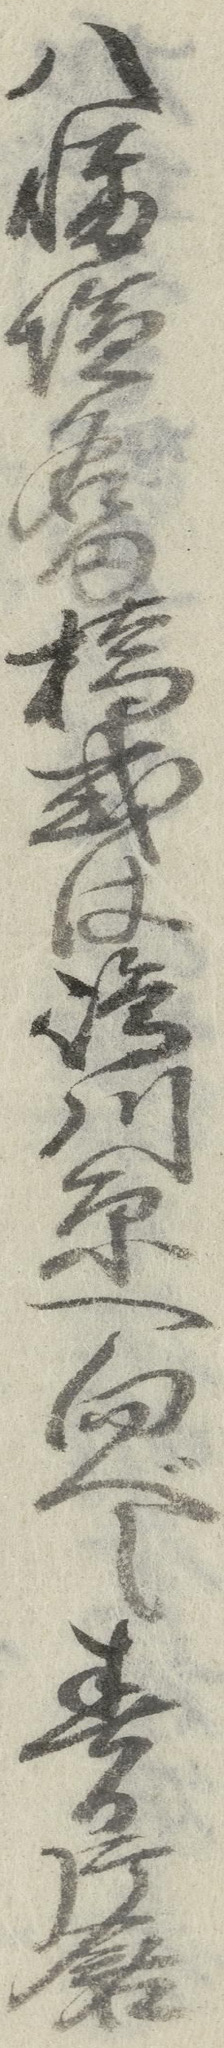八幡塩名田橋或は嶋川原へ向べし春日片倉
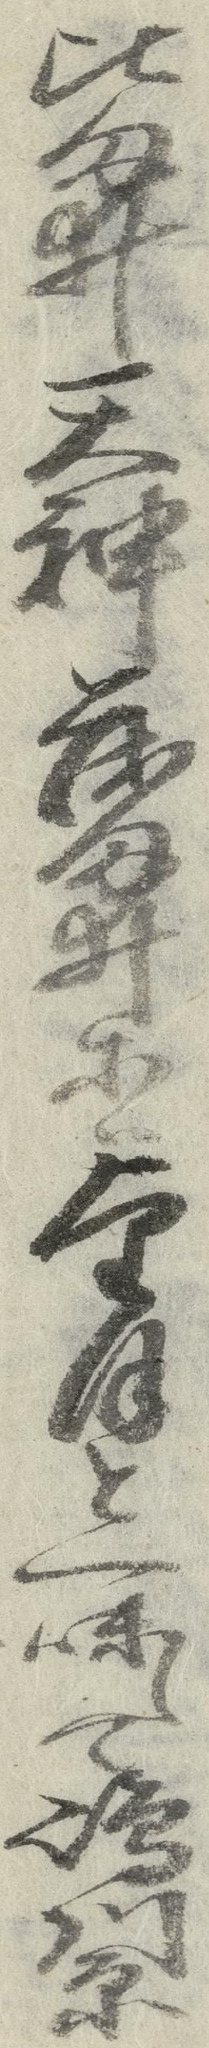比多井天神茂多井等は望月と一味して嶋川原
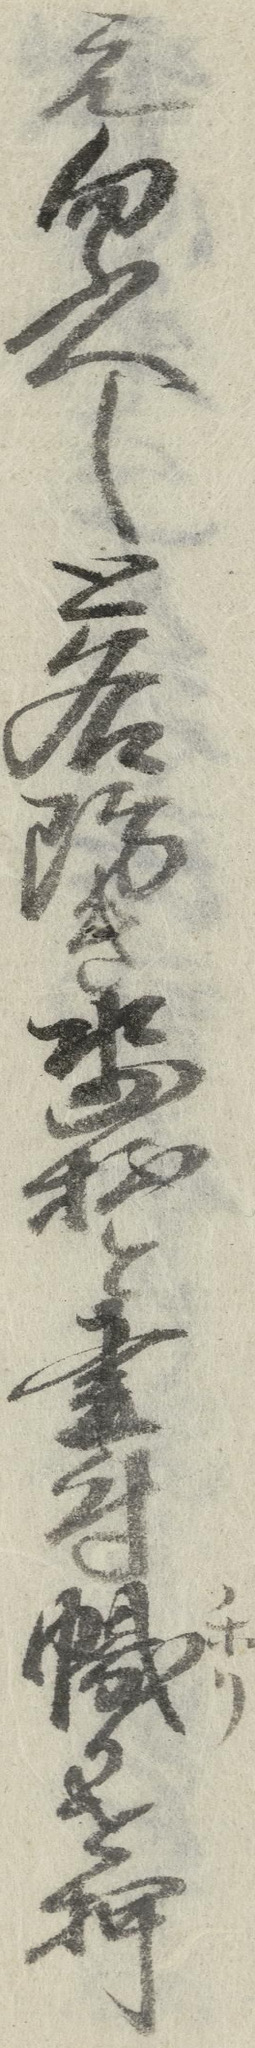え向ふへしと各防き決抔と書付幟りを押
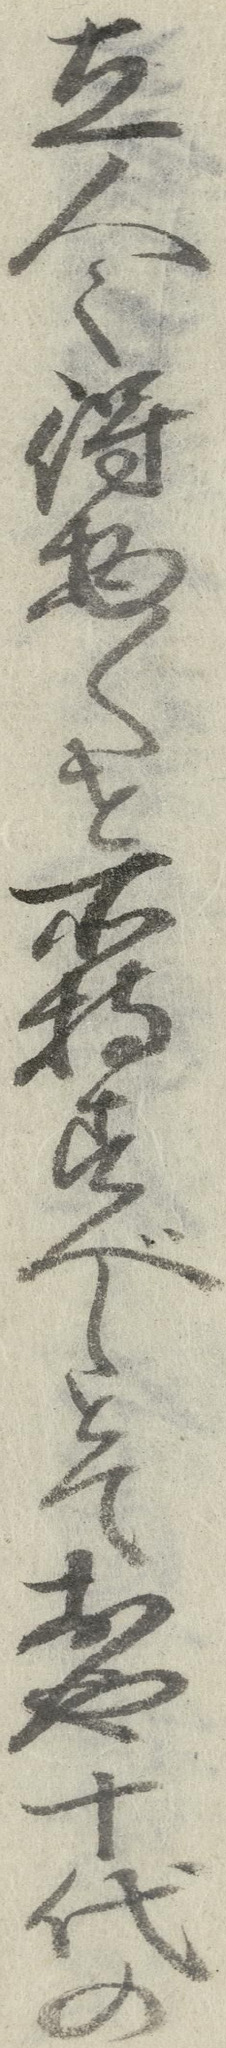立人々得物〳〵を所持すべしとておや十代の
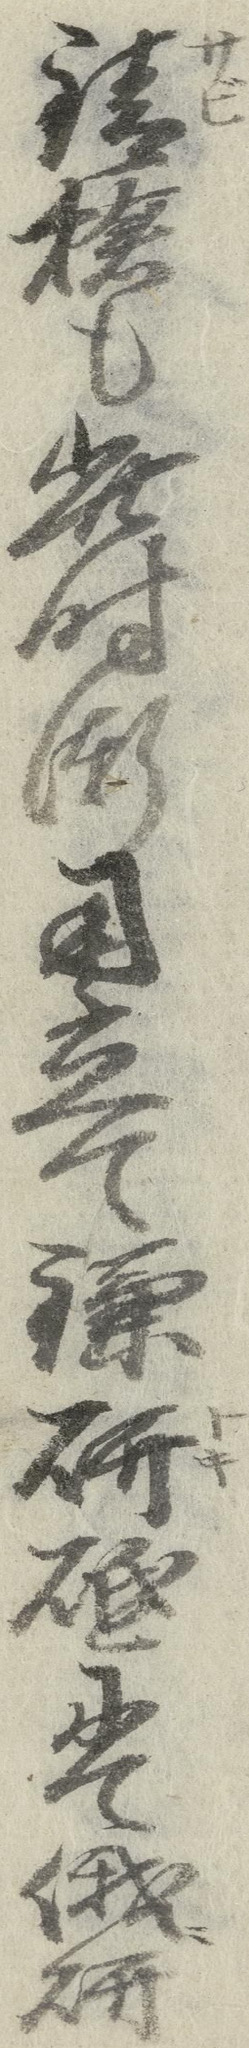錆槍も此時漸用立て鎌-研砥にて俄に研
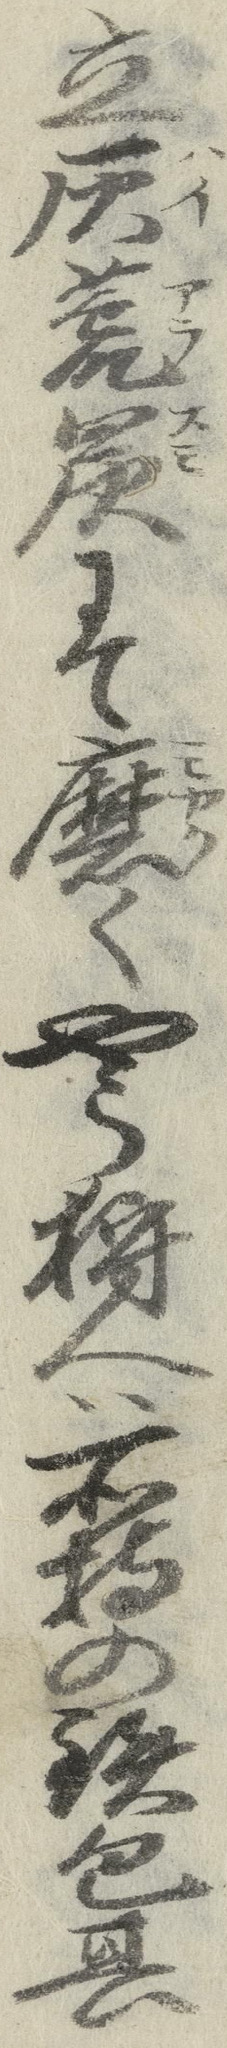立灰荒炭にて磨くやら狩人は所持の鉄包其

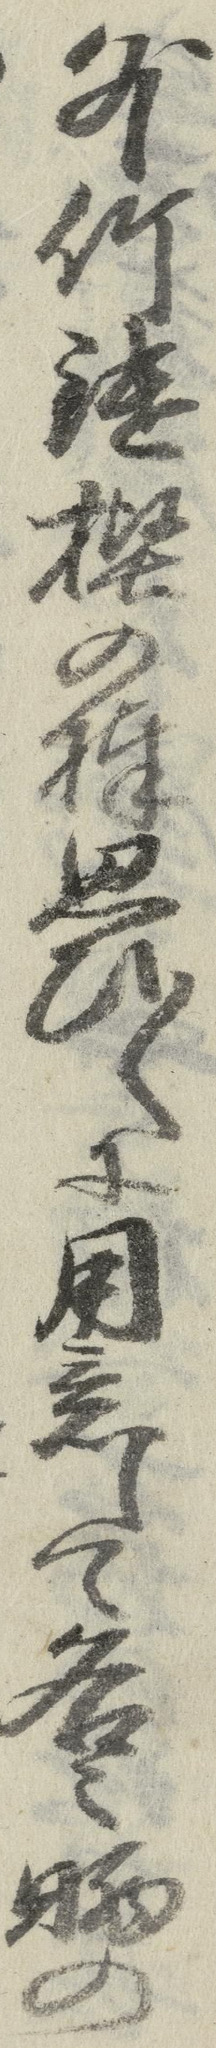外竹鑓樫の棒思ひ〳〵に用意して各々晒の
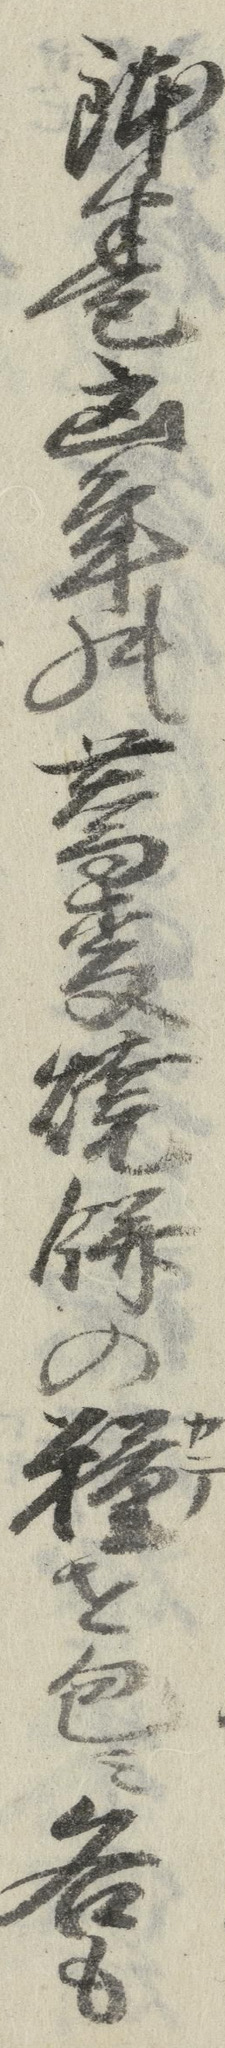鉢巻凶年の蕎麦焼餅の-糧を包み各も
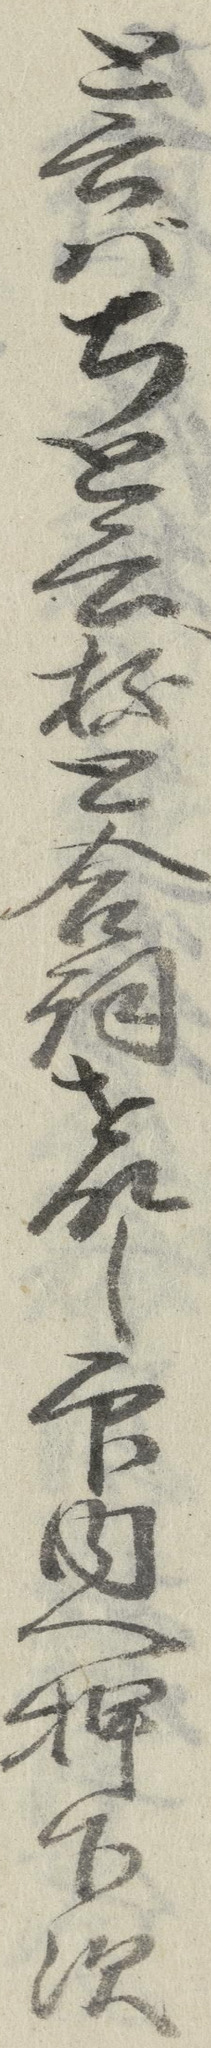と云ばちと云抔と合詞を記し印内へ押下次
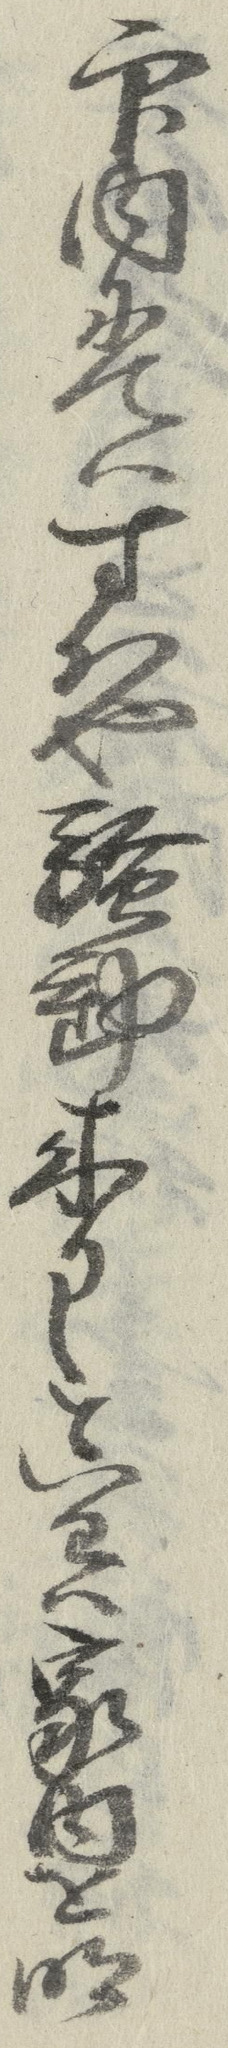印内にてはすわや騒動来りしといわは家内を明
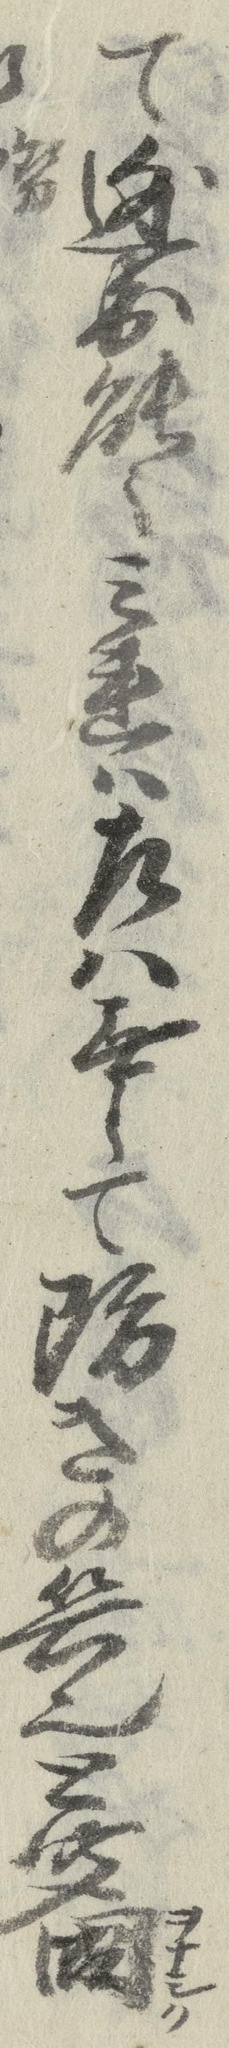て迯出能〻みれは左は無して防きの筈也と聞-同
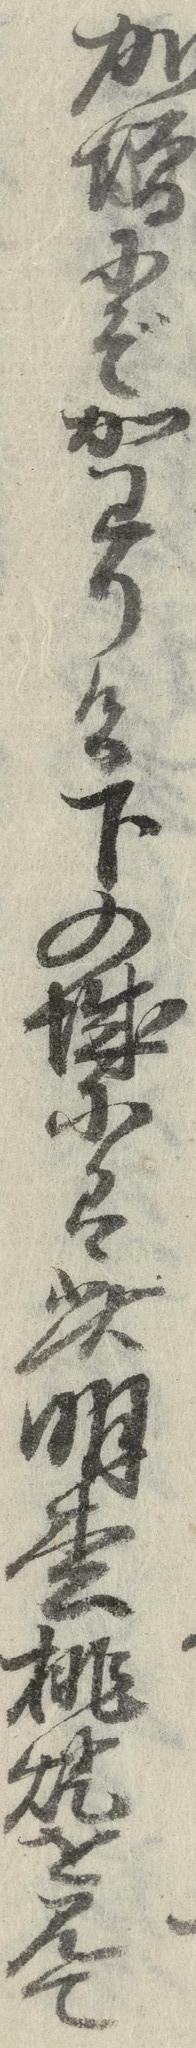加-増にぞ加わりける下の城にそ此明松桃焼を見て
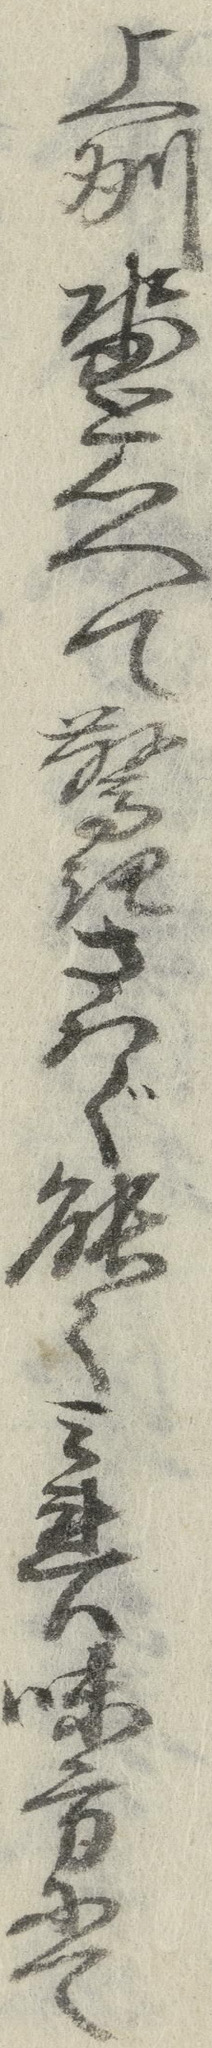上州決と心へて驚きさわぐ能々みれは味方にて
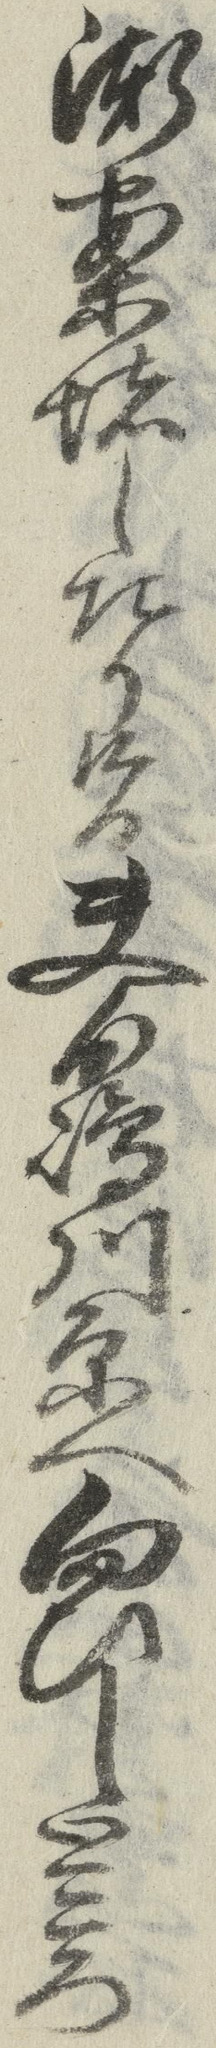漸案堵したりける夫ゟ嶋川原へ向ひしところ
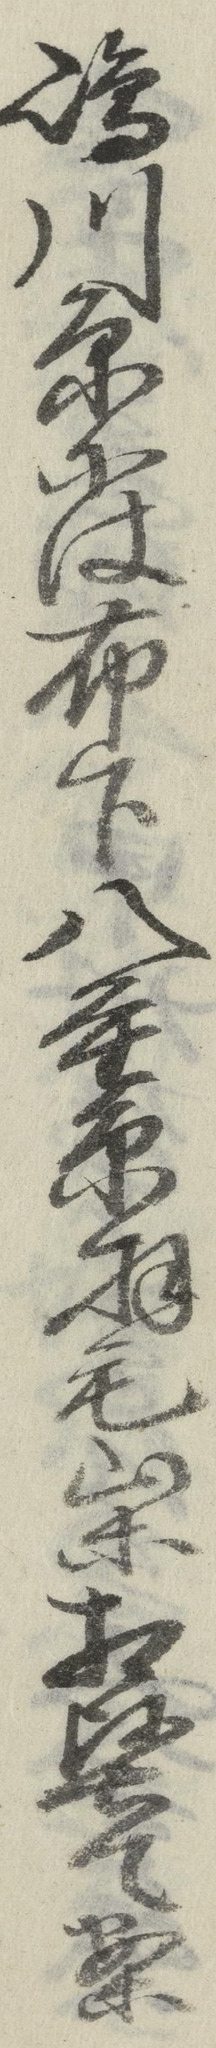嶋川原には布下八重原羽毛山等相堅て案
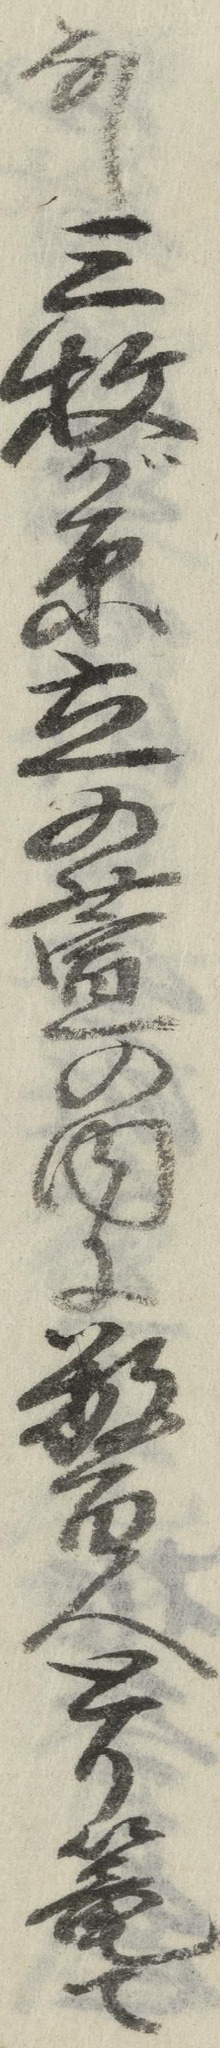なし三牧が原立の萱の内に數百人とり篭て
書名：浅間大焼騒動記　下
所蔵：東京大学地震研究所図書室 Earthquake Research Institute Library, The University of Tokyo, JAPAN
